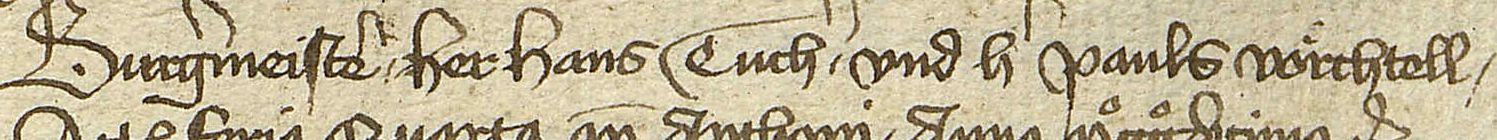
Burg*meiſte* her hans Tuch* / vnd h* Pauls Vörchtell /
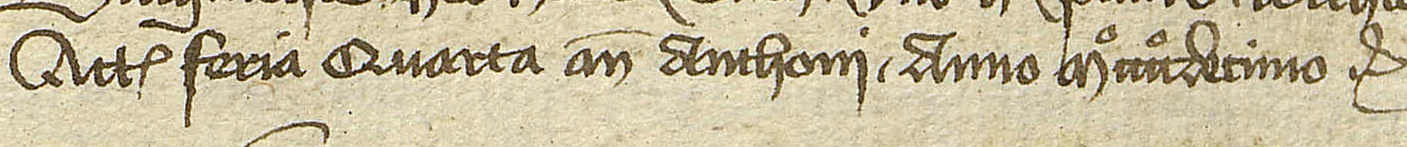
Act* feria Quarta an* Anthoni / Anno M* cccc*decimo §
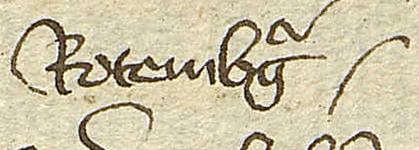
Rotemb*g /
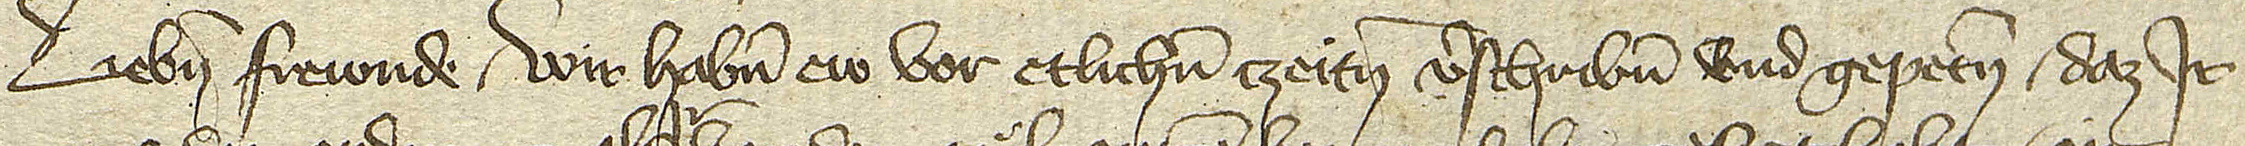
Liebn* frewnde / wir habn* ew vor etlichn* cʒeitn* v*ſchribn* vnd gepetn* / daʒ Ir
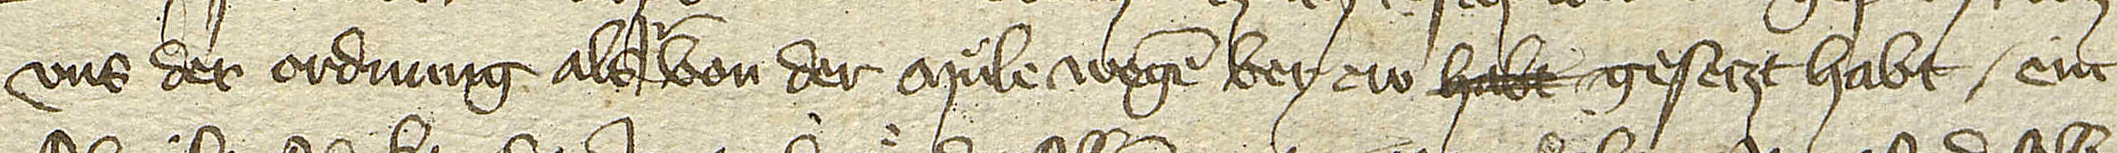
vns der ordnung als / von der Müle wege* bey ew habt geſecʒt habt / ein
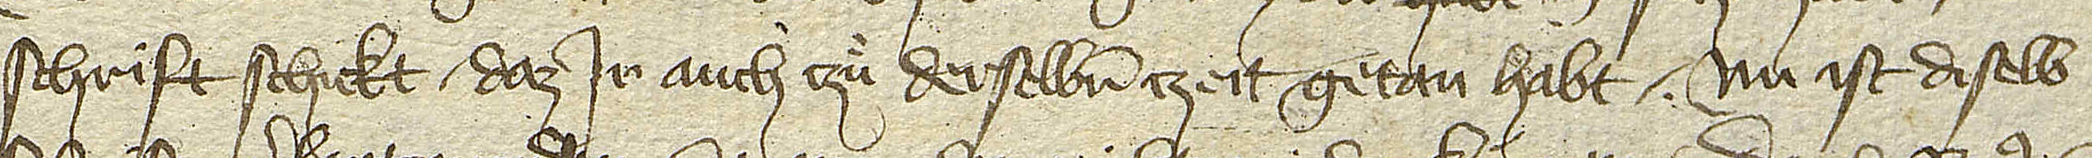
ſchrift ſchickt / daʒ Ir auch cʒü derſelbn* cʒeit getan habt / . Nu iſt diſelb
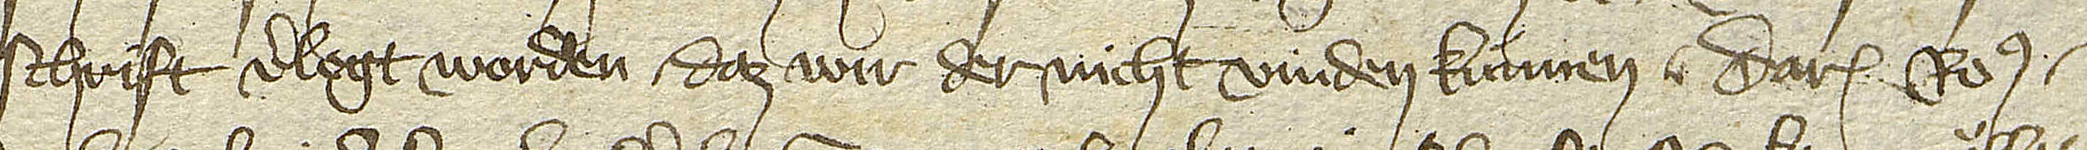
ſchrift v*legt worden / daʒ wir der nicht vinden künnen / . Dar* Ro* /
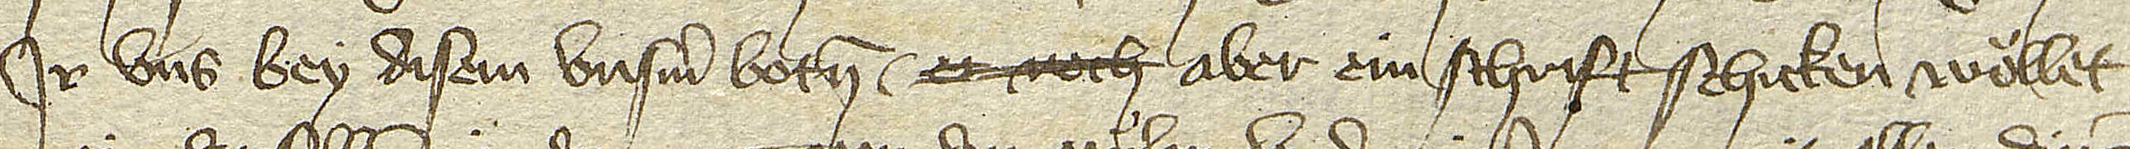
Ir vns bey diſem vnſm* botn* / er noch aber ein ſchrift ſchicken wöllet
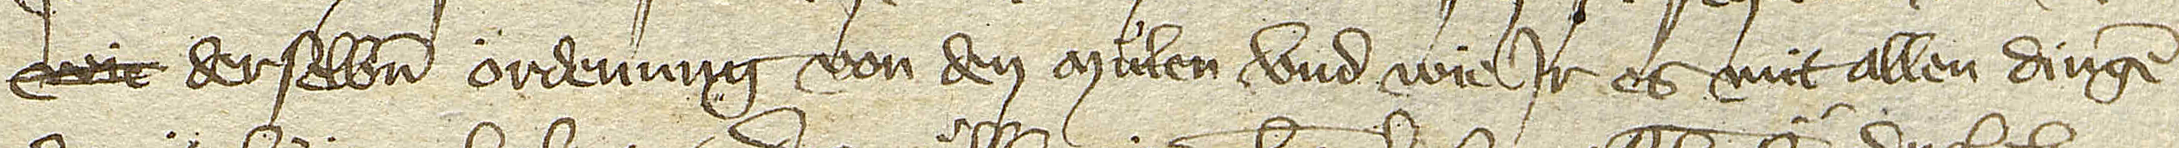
wie derſelbn* ördenung von den Mülen / vnd wie Ir es mit allen dinge*
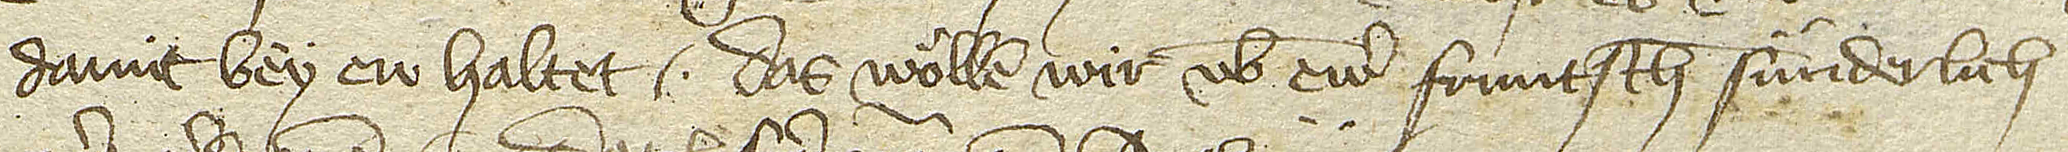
damit bey ew haltet / . Das wölle* wir vb* ew* fruntſch* füriderlich
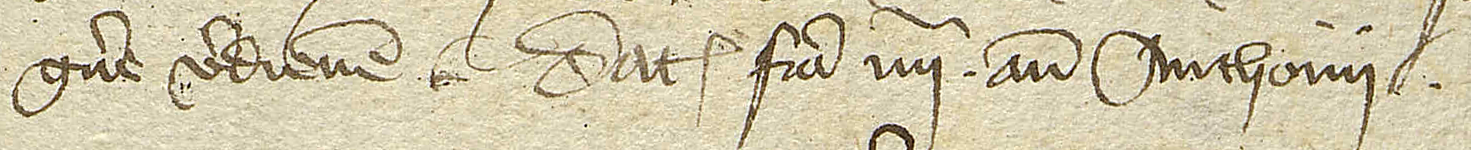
g*ne v*diene* / Dat* fia* iiii* . an* Anthoni / .
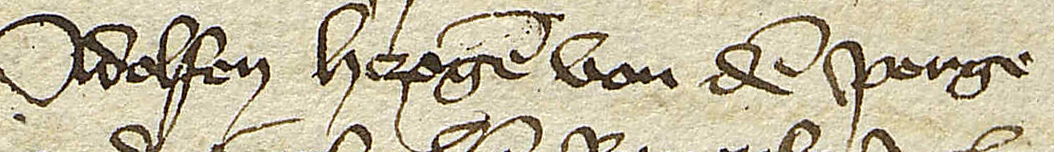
Adolfen h*cʒoge* von d* Porge
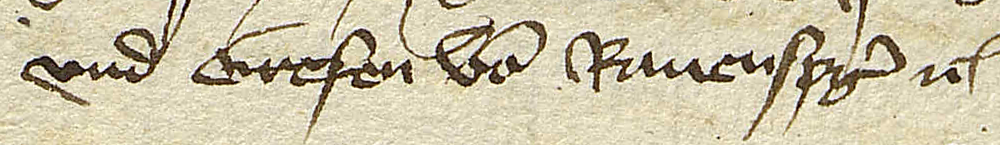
vnd Grefen vo* Rauenſpg* ec*
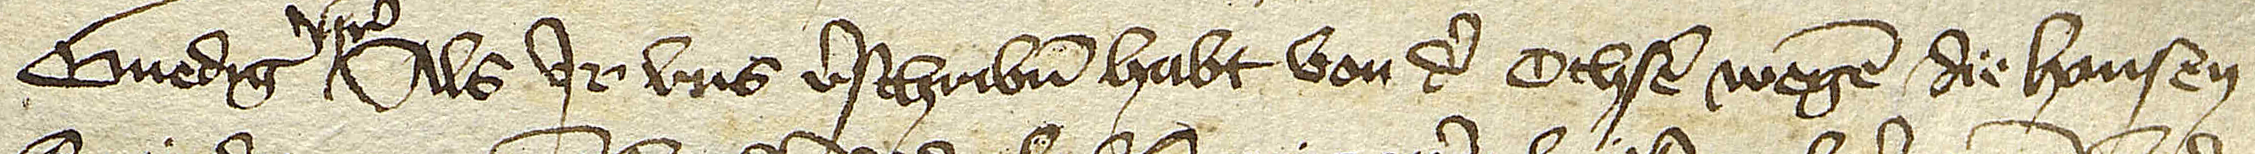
Gnedig* / Als Ir vns v*ſchribn* habt von d* Ochſe* wege* / die hanſen
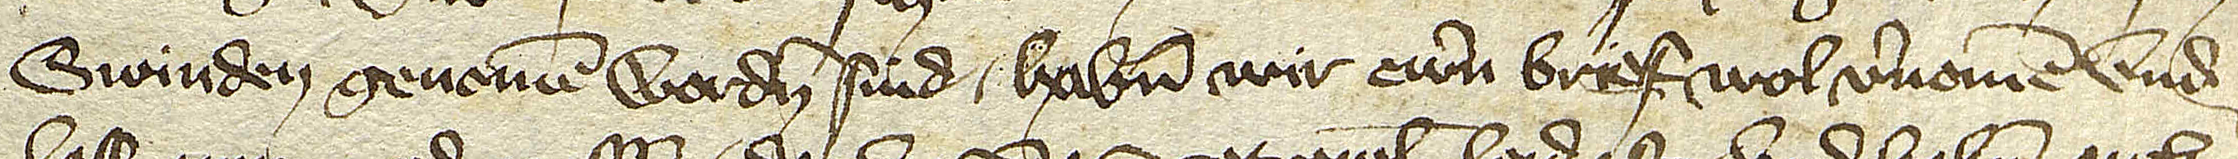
Swinden genome* wordn* ſind / habn* wir ewn* brief wol v*nome* vnd
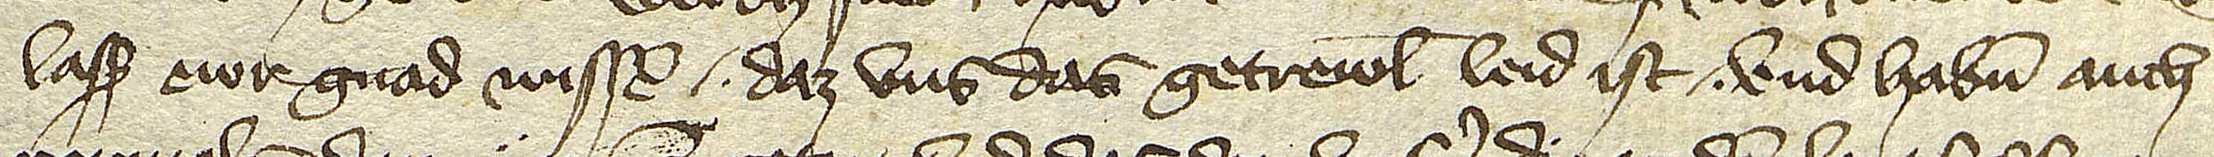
laſſ* ewr gnad wiſſe* / . daʒ vns das getrewl* leid iſt / . vnd habn* auch
